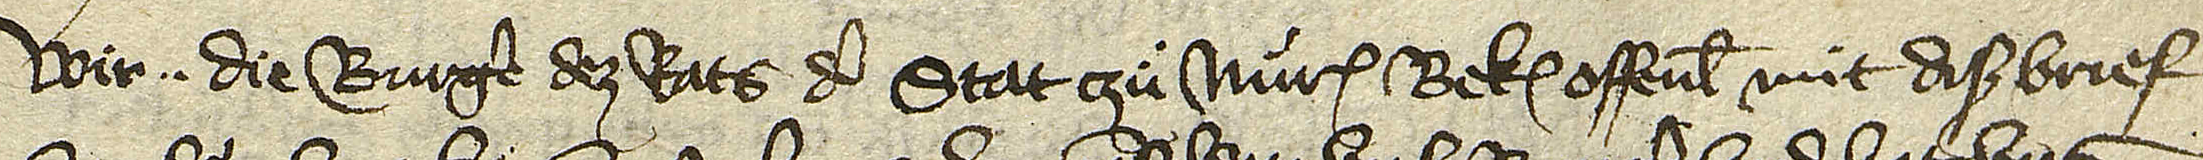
wir ~ die Burge* deʒ Rats d* Stat cʒü Nür* Bek* offenl* mit diſʒ brief
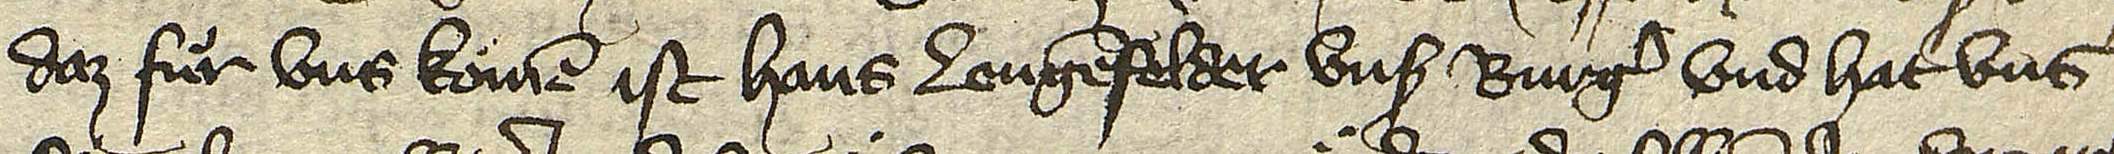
daʒ für vns köme* iſt hans Lange*felder vnſ* Burg* vnd hat vns
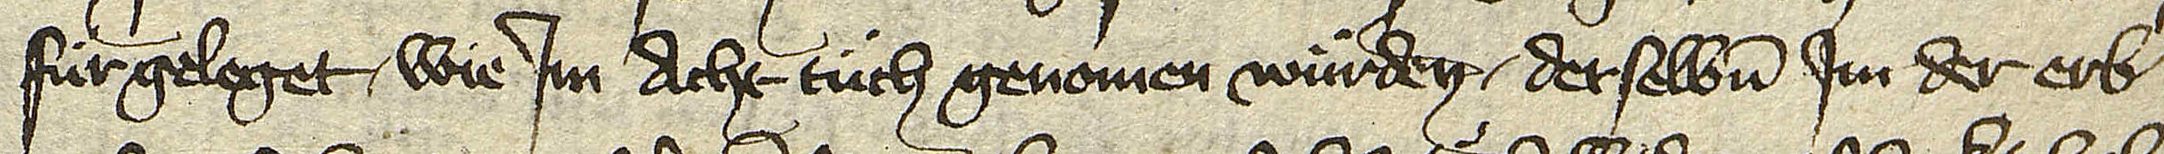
fürgeleget / wie Im Acht tüch genomen würden / derſelbn* Im der erb*
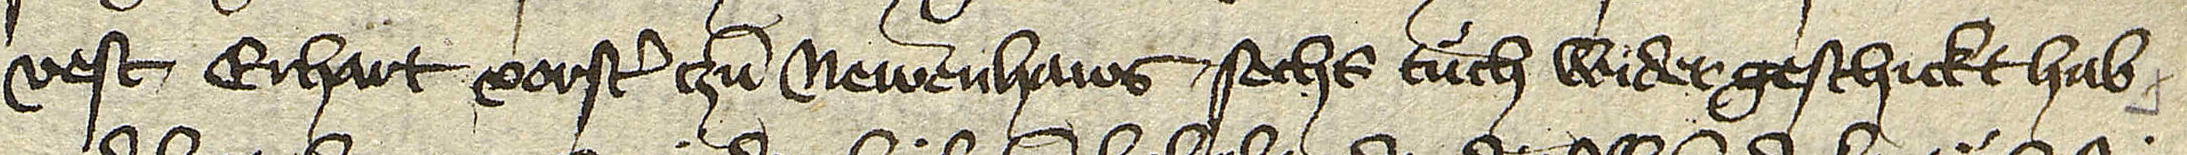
veſt / Erhart vorſt* cʒu* Newenhaws ſechs tüch wider geſchickt hab
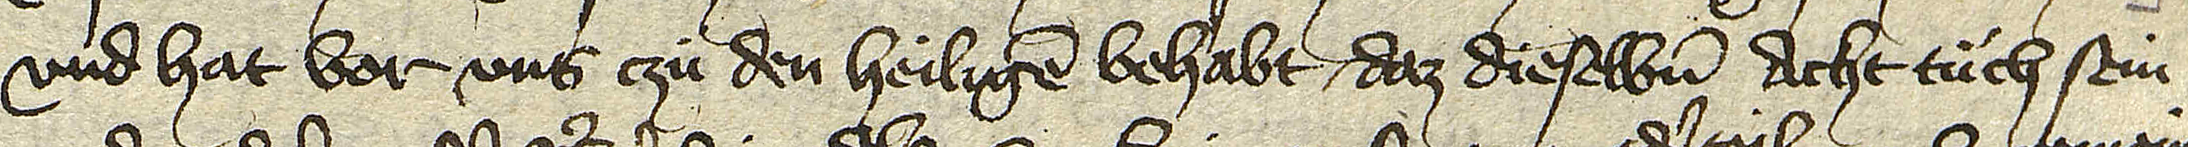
vnd hat vor vns cʒü den heilige* behabt / daʒ dieſelbn* Acht tüch ſein
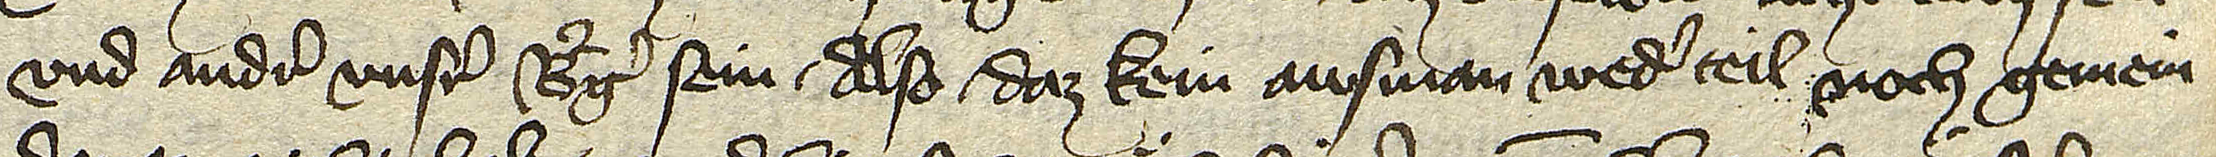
vnd andr* vnſr* B*g* ſein / Alſo / daʒ kein awſman wed* teil noch gemein
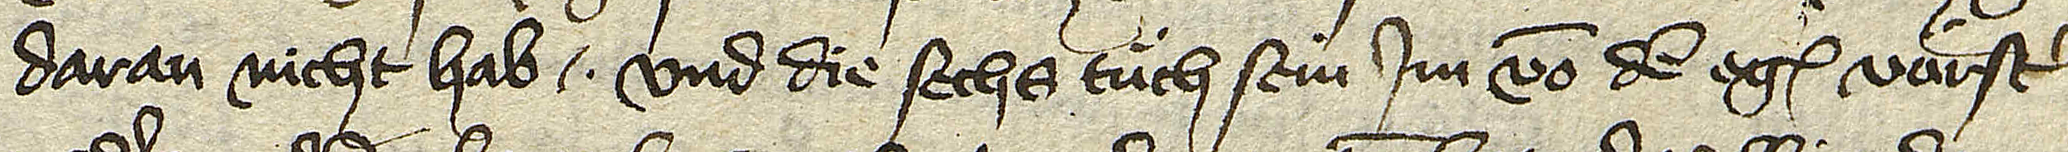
daran nicht hab / . vnd die ſechs tüch ſein Im vo* d* eg* vörſt*
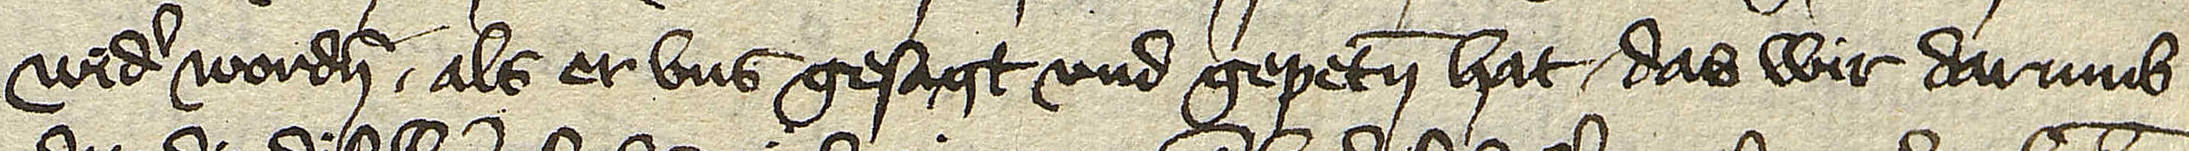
wid* wordn* / als er vns geſagt vnd gepetn* hat / das wir darumb
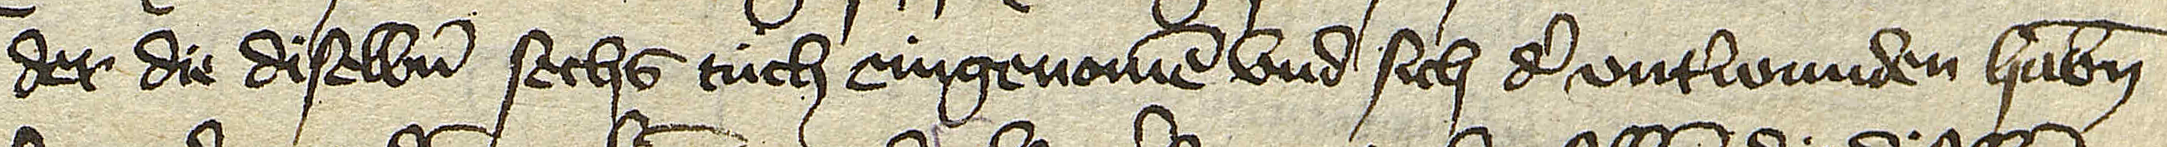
der die dieſelbn* ſechs tüch eingenome* vnd ſich d* vnt*wunden habn*
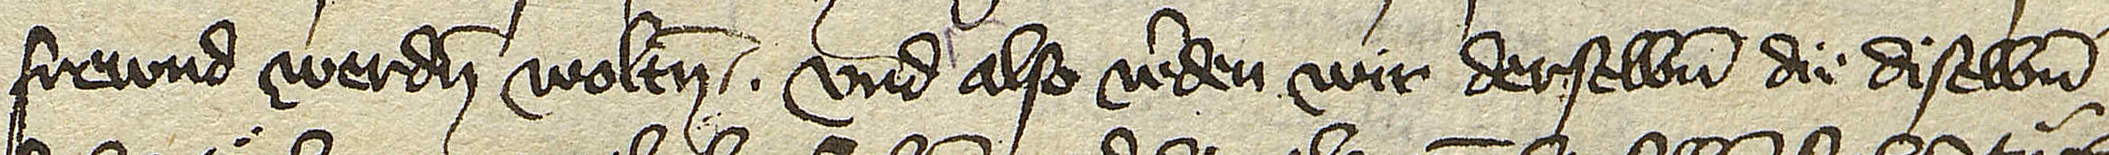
frewnd werdn* woltn* / . vnd alſo w*den wir derſelbn* die diſelbn*
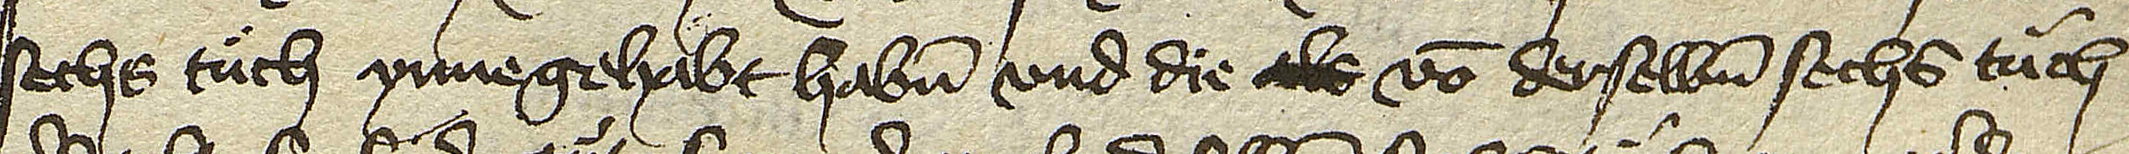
ſechs tüch ynnegehabt habn* vnd die als vo* derſelbn* ſechs tüch
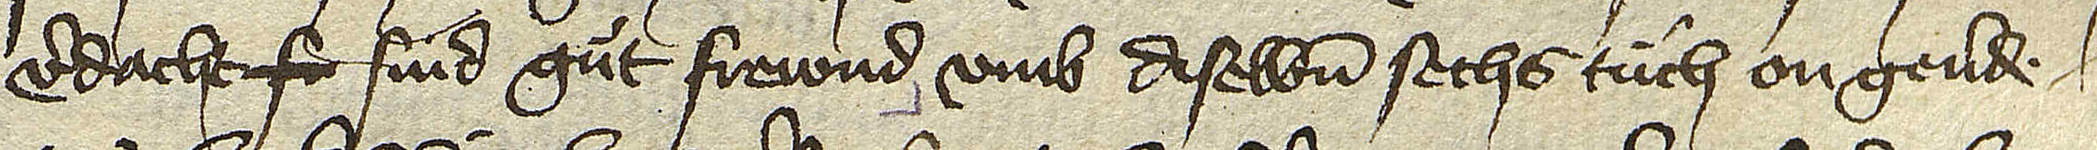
v*dacht ſn ſind güt frewnd vmb diſelbn* ſechs tüch on geu*de /
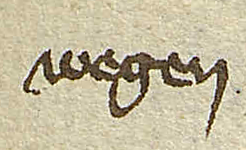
wegen
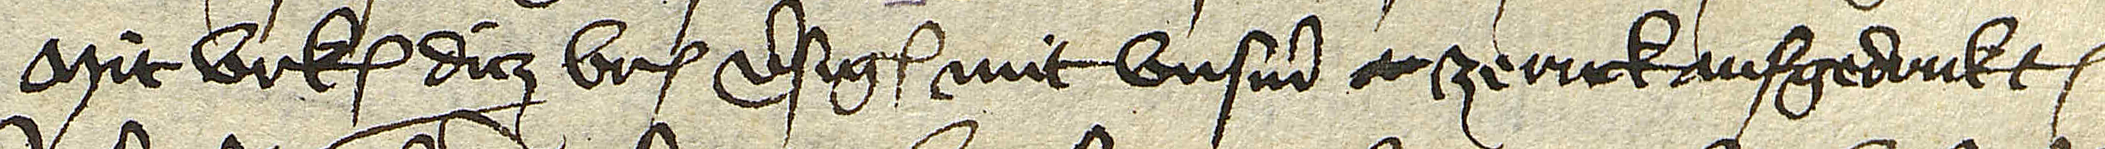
Mit vrk* dicʒ v*ſig* mit vnſm* a cʒeruck aufgedrukt*
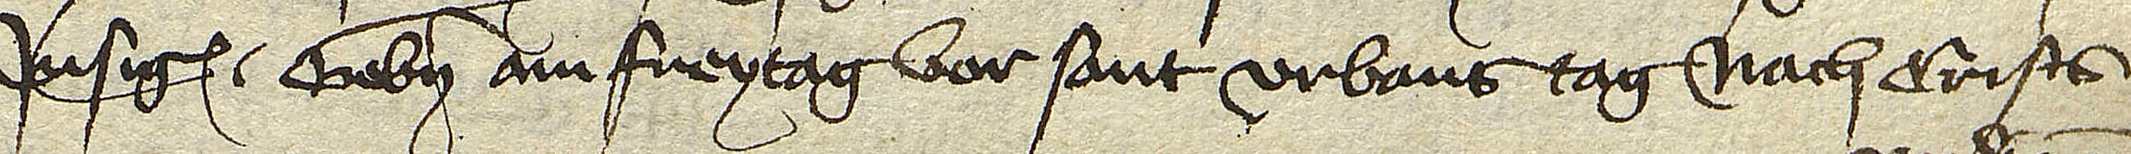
Inſig* / Gebn* am freytag vor ſant vrbans tag Nach Criſts
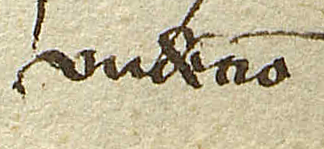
vndecio*
